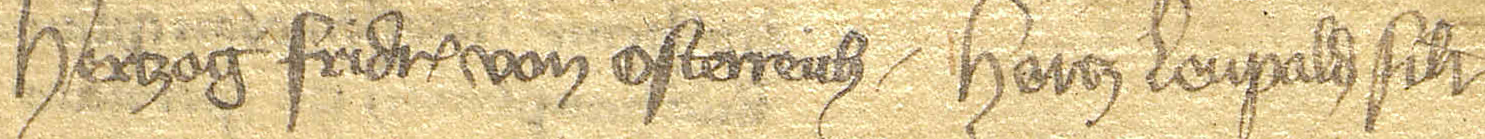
hercʒog fridr* von Oſterreich / hercʒ* Leupold* ſilr*
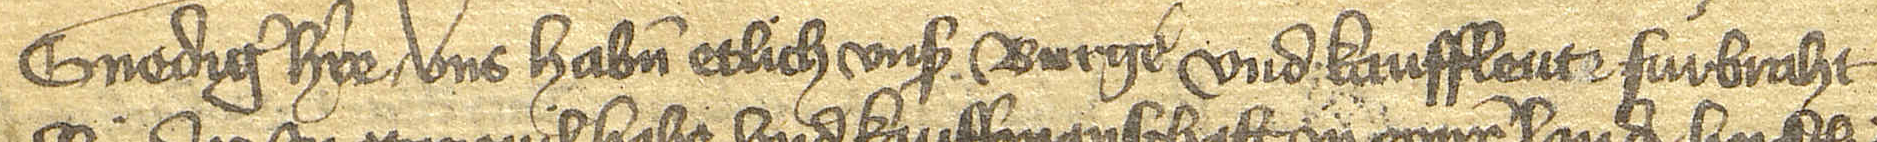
Gnedig* h*re / Vns habn* etlich vnſ* Burge* vnd kauffleute fürbraht
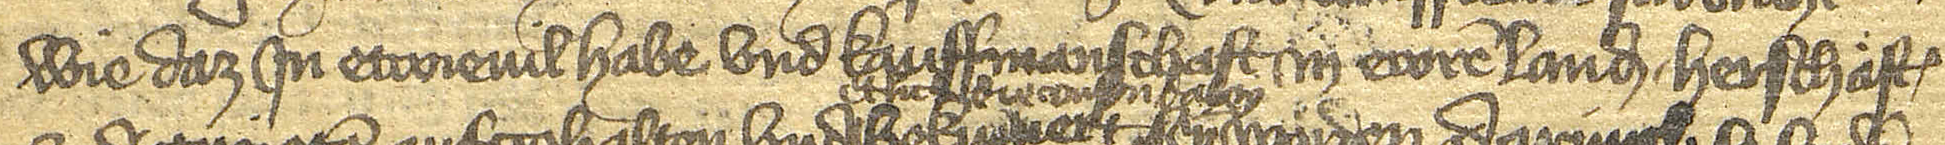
wie daʒ In etwieuil habe vnd kauffmanſchaft in ewre* land* / herſchäft*
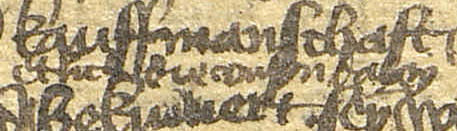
etlich die vnſ*n dabey
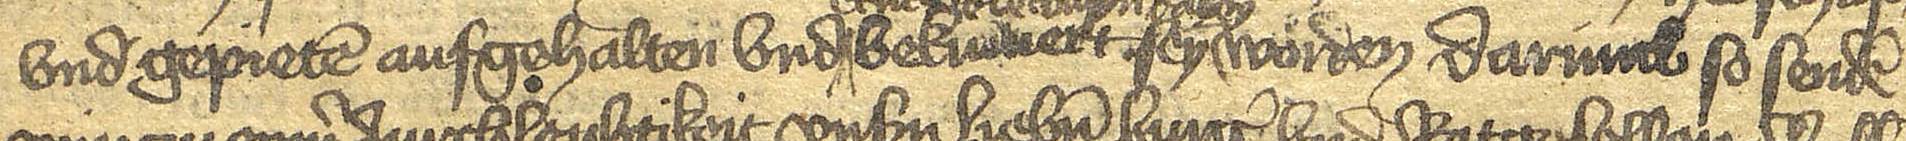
vnd gepiete* aufgehalten vnd bekumert ſey worden / Darümb ſo ſende*
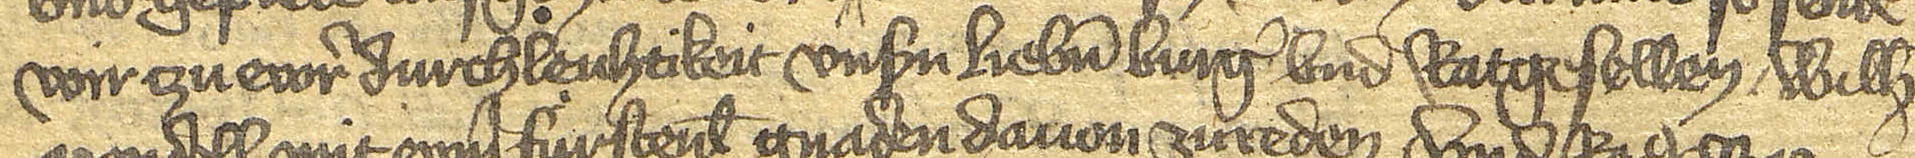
wir cʒu ewr* durchleuhtikeit vnſ*n liebn* burg* vnd Ratgeſellen / Wilh*
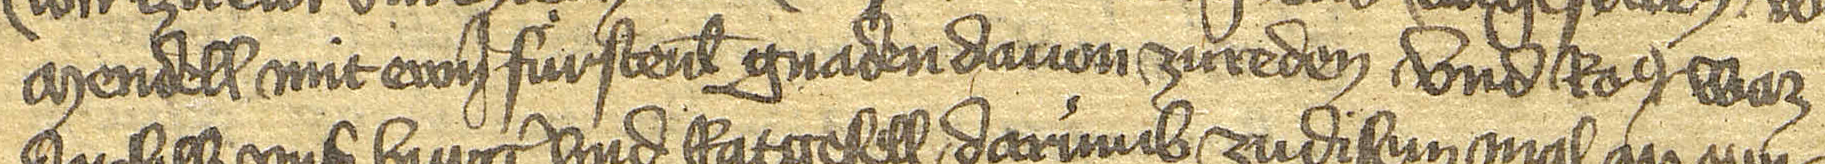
Mendell mit ewn* fürſtenl* gnaden dauon cʒureden / Vnd Ro* / waʒ
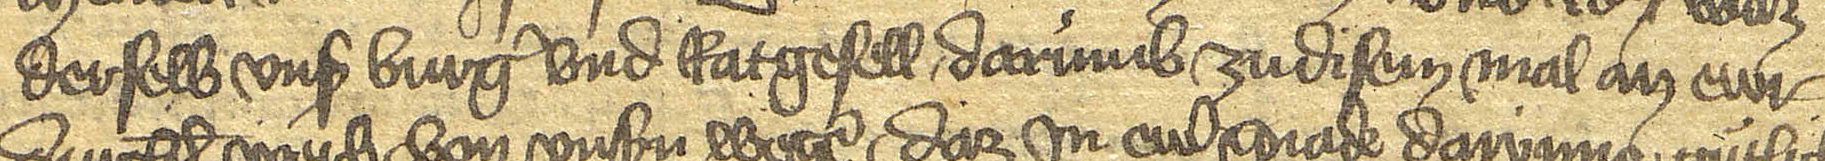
derſelb vnſ* burg* vnd Ratgeſell / darümb cʒu diſem mal an ewr
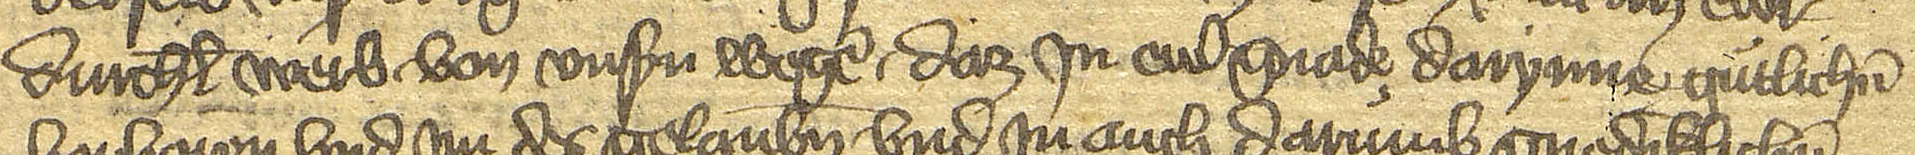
durchl* werb / von vnſ*n wege* / daʒ In ew* gnade darynne gütlichn*
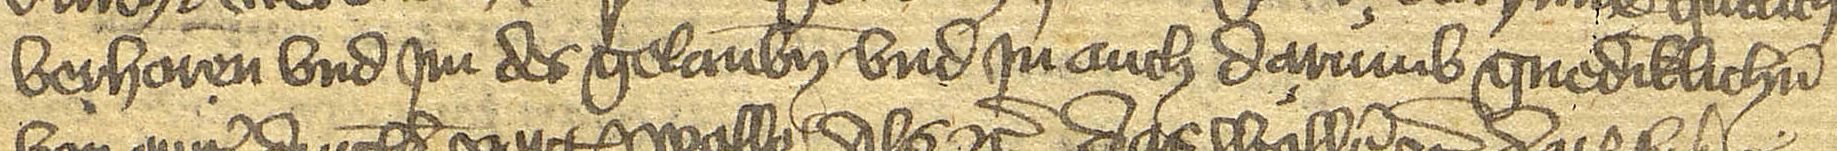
verhoren vnd Im des gelaubn* / vnd In auch darümb gnediklichn*
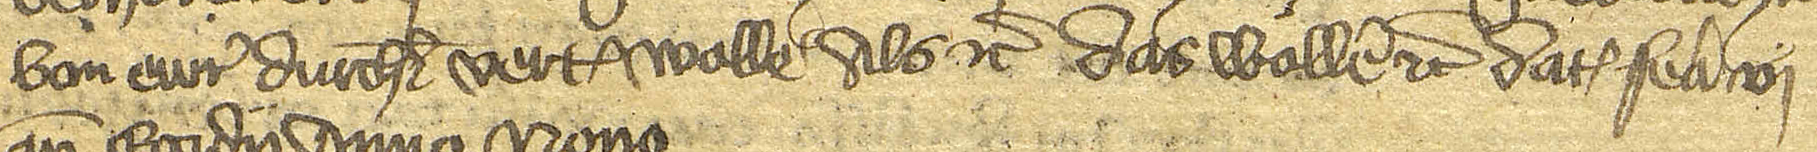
von ewr* durchl* vert* wolle / Als ec* das wölle* ec* Dat* fea* vi
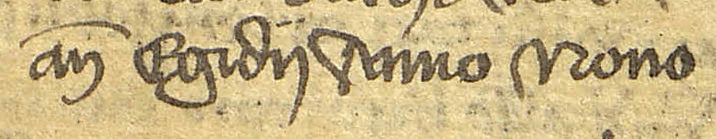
an* Egidii Anno Nono
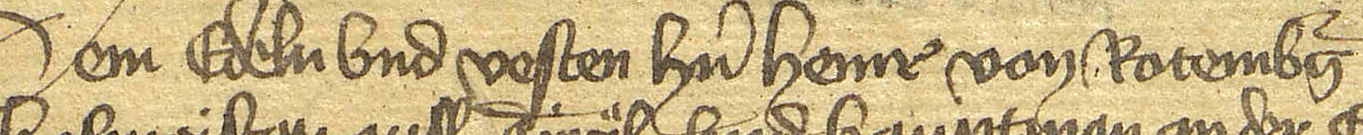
Dem Edeln vnd veſten hn* heinr* von Rotemb*g
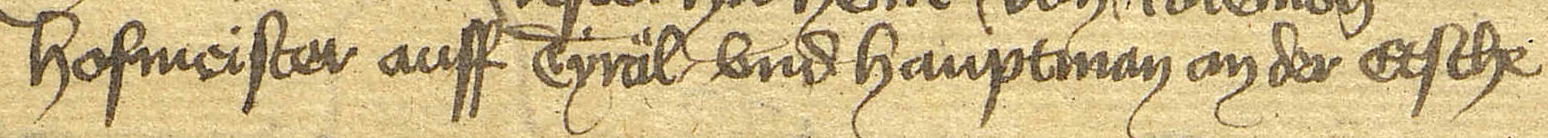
hofmeiſter auff Tyröl / vnd hauptman an der Etſche
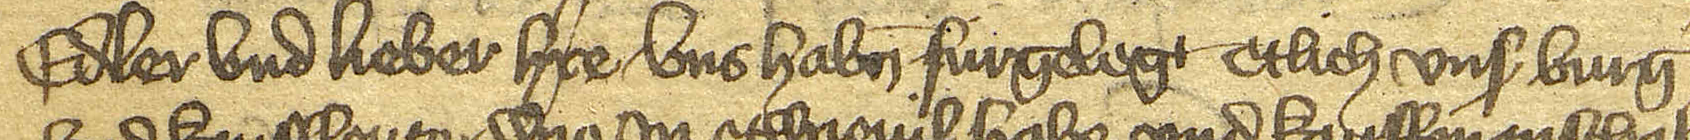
Edler vnd lieber h*re / vns habn* fürgelegt etlich vnſ* burg*
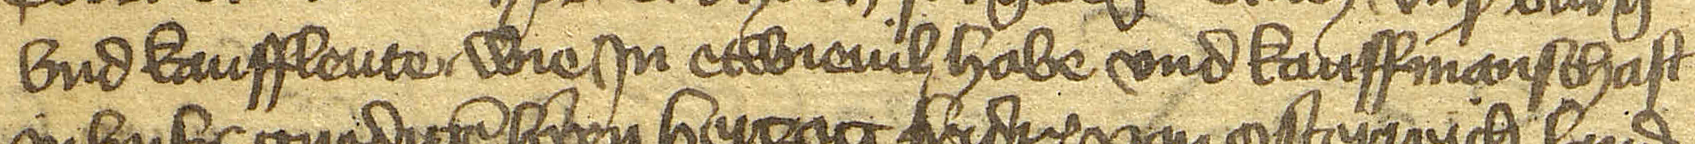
vnd kauffleute / wie In etwieuil habe vnd kauffmanſchaft
